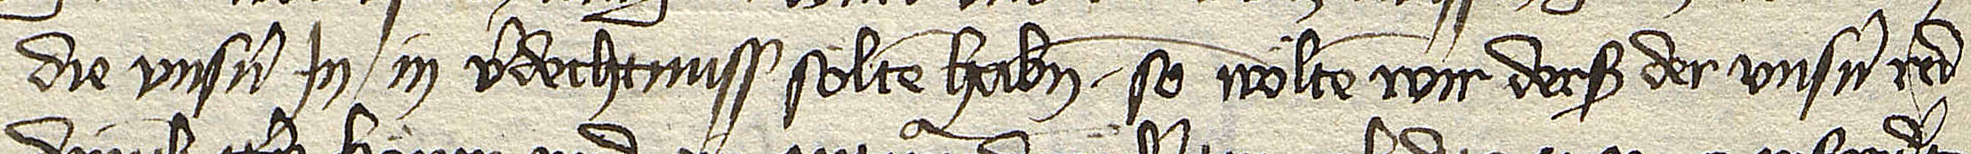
die vnſn* In in v*dechtnuſſ ſölte* habn* / ſo wölte* wir derſ* der vnſn* red
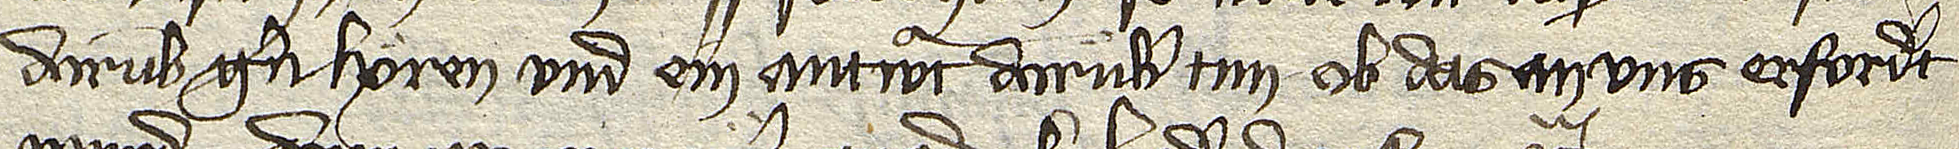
darub* g*n hören vnd ein antw*t darüb* tun ob das an vns erford*t
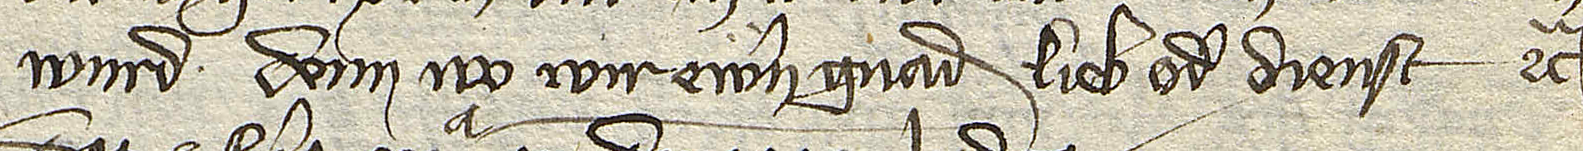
wurd . Denn wo wir eẅ*n gnad* lieb od* dienſt ec*
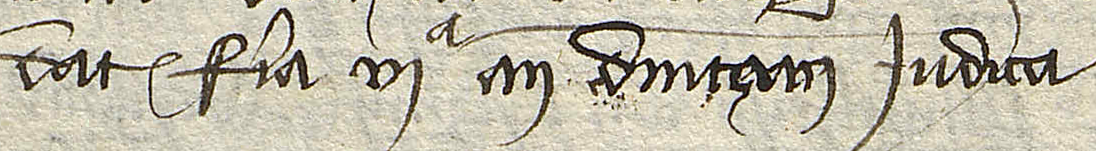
Dat* fi*a vi* an dni*cam Iudica
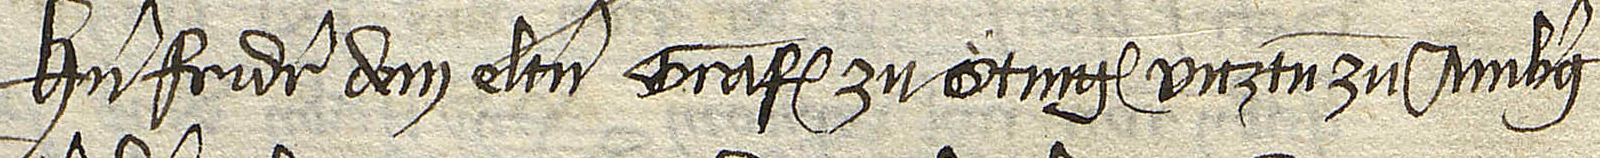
Hn* fridr* dem eltn* Graf* ʒu Öting* vicʒtu* ʒu Amb*g
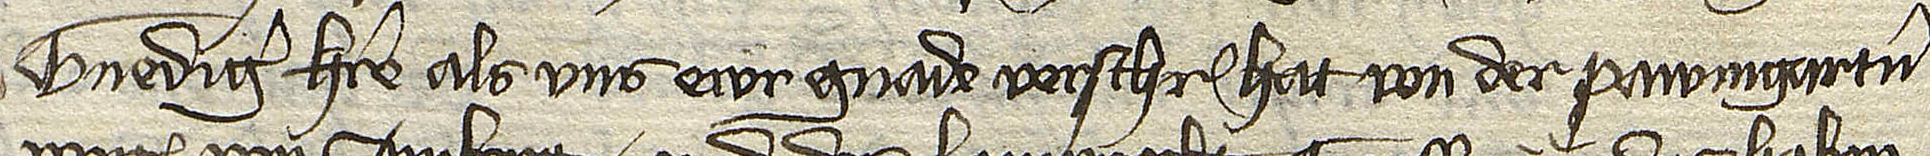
Gnedig* h*re als vns eẅr gnade verſchr* hat von der pawmgartn*
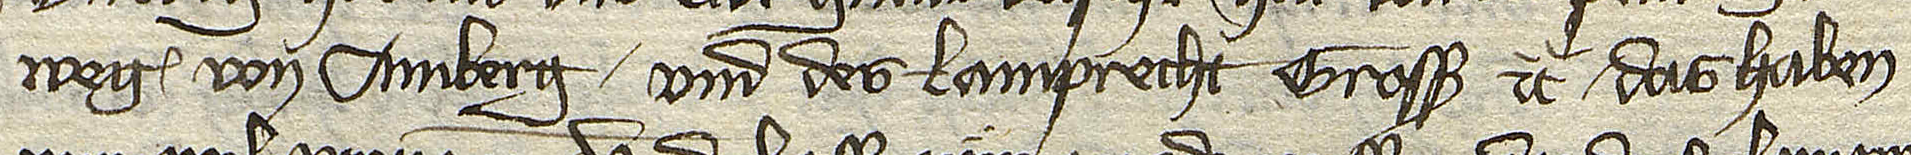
weg* von Amberg / vnd des lamprecht Groſſ* ec* / Das haben
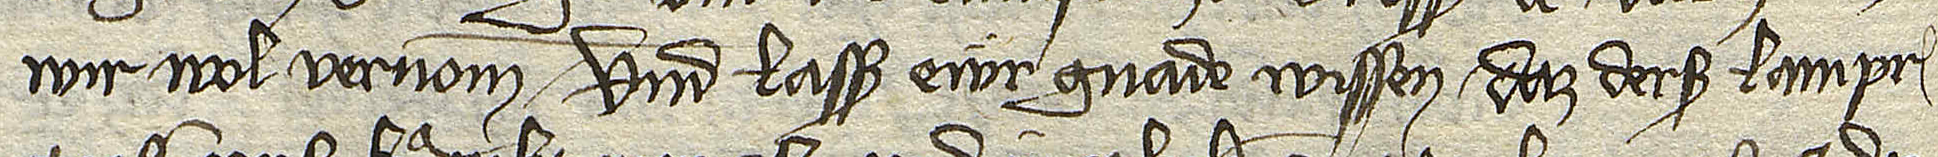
wir wol vernom* / Vnd laſſ* eẅr gnade wiſſen / daʒ derſ* lampr*
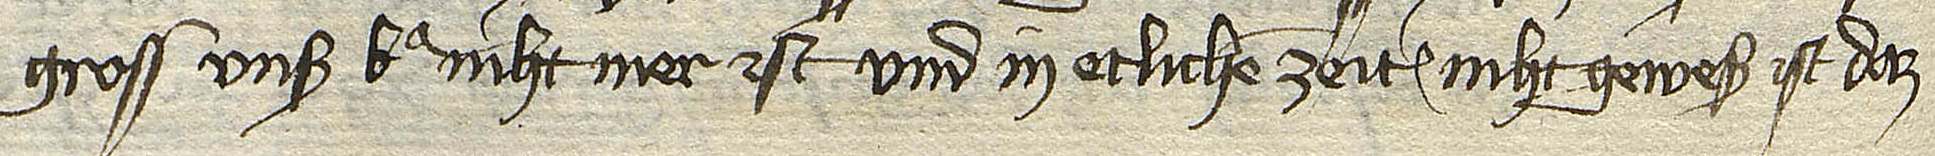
groſſ vnſ* b* niht mer iſt vnd in etliche* ʒeit* niht geweſ* iſt daʒ
